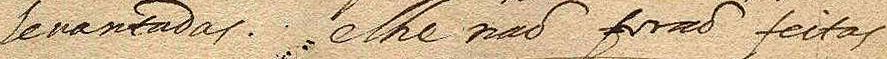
levantadas e lhe naõ foraõ feitas
